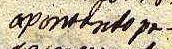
apontanto pa
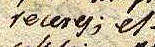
receres; es
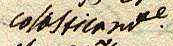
colasticam.te
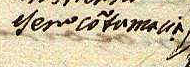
e sem cōtumacia
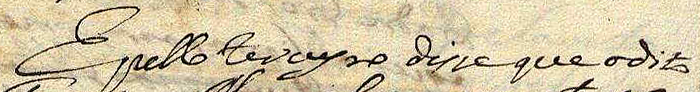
E pello terceyro disse que o dito
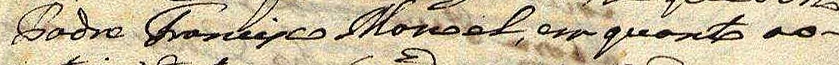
Padre Francisco Manoel, emquanto ao
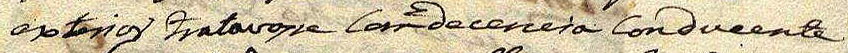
exterior tratavasse Com decencia Conducente
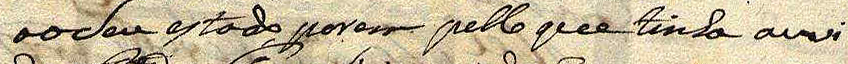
ao seu estado, porem pello que tinha ouvi
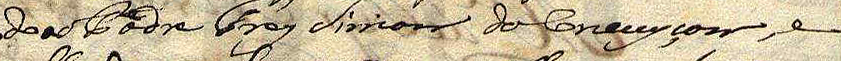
do o Padre Frey simon da Conceyçam, e
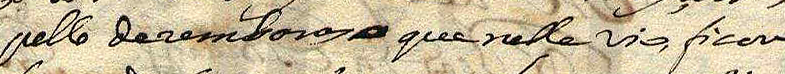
pello dezembaraso que nelle vio, ficou
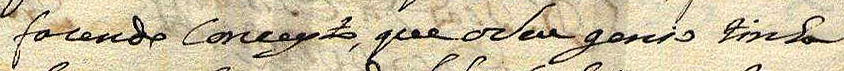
fazendo conceyto, que o seu genio tinha
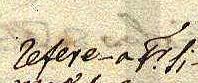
Refere- a Fr. si
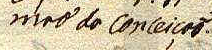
maõ da conceiçaõ.
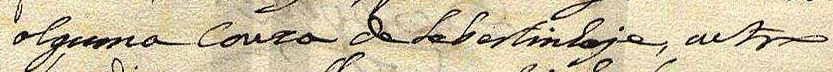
alguma couza de Labertinhaje, outro
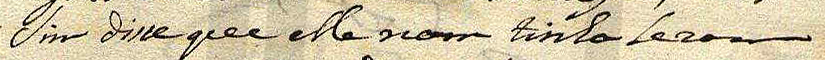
Sim disse que elle nam tinha lezam
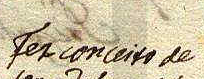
fez conceito de
